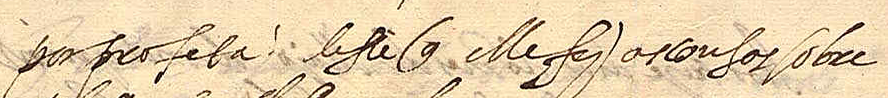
por profeta? disse q̄ elle fez as cousas sobre
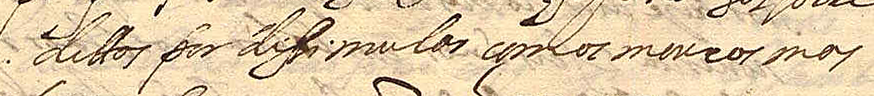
dittas por dissimular com os mouros mas
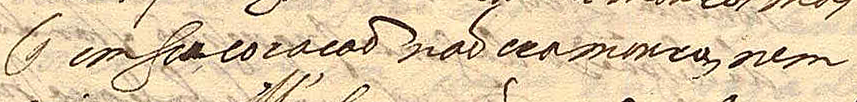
q̄ em seu coraçaõ naõ era mouro, nem
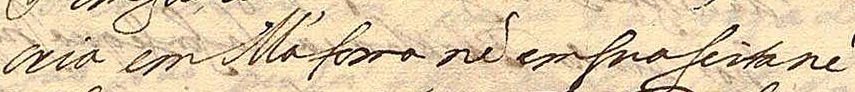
cria em Mafoma nē em sua seita nē
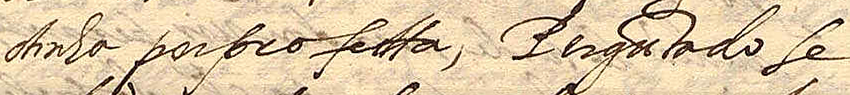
o tinha por profetta, Pergūtado se
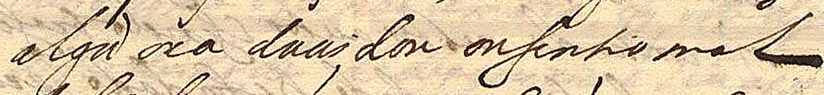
algū ora duuidou ou sentio mal
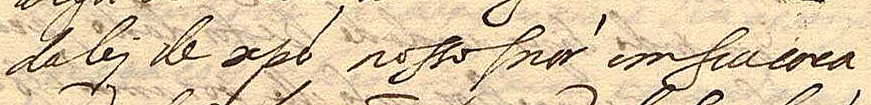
da lej de xpō nosso snor̄ em seu cora
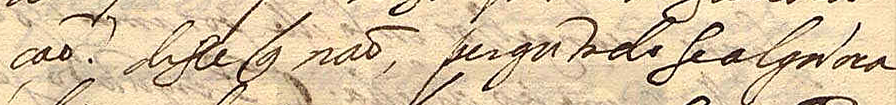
çaõ? disse q̄ naõ, pergūtado se algū ora
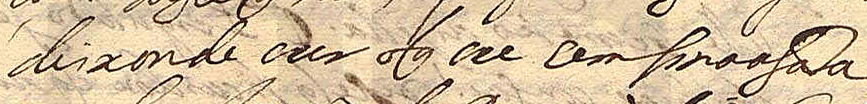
deixou de crer o q̄ cre E emsina a sāta
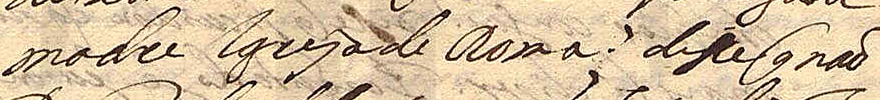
madre Igreja de Roma? disse q̄ naõ
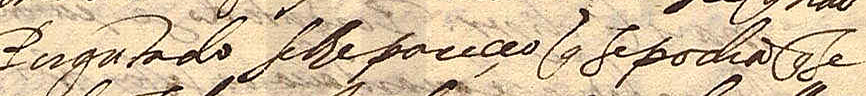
Pergūtado se lhe pareceo q̄ se podia q̄ se
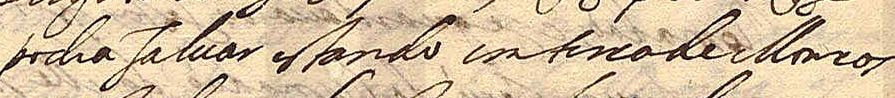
podia saluar estando em terra de Mouros
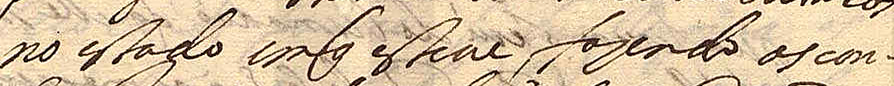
no estado em q̄ esteue, fazendo as cou
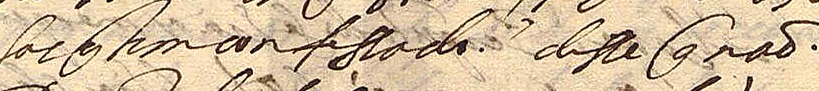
sas q̄ tem confessado? disse q̄ naõ
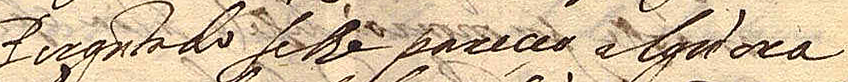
Pergūtado se lhe pareceo algū ora
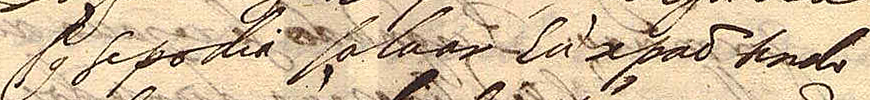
q̄ se podia saluar hū xpaõ tendo
